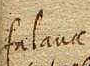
falaua
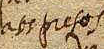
aos presos
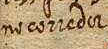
no corredor
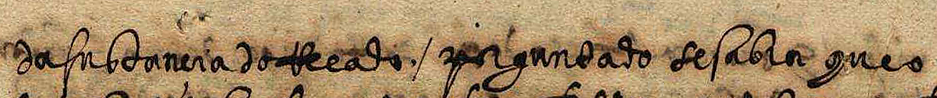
da sustançia do Recado. / perguntado se sabia que o
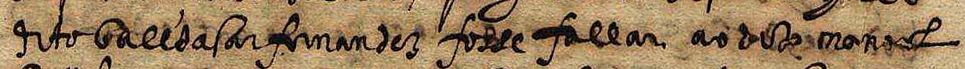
dito balltasar fernandez fosse fallar ao dito manoel
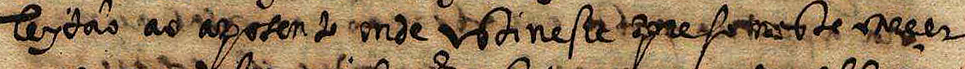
leytaõ ao aposento onde estiuesse preso neste carcer
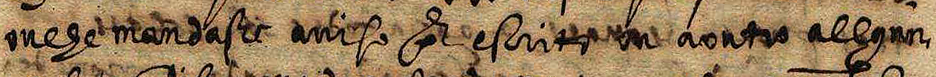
ou lhe mandasse auiso por escrito ou a outro allgun
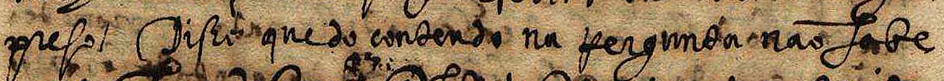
preso/ Disse que do conteudo na pergunta naõ sabe
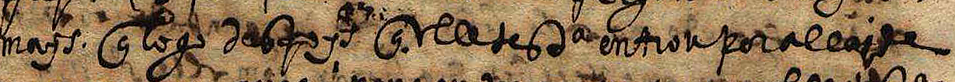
mays. q̄ logo despoys q̄ elle testa entrou por alcajde
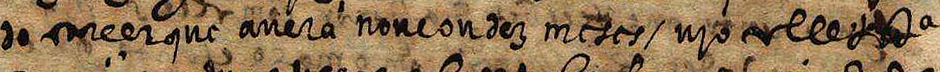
do carcer que auera noue ou dez meses / ujo elle testa
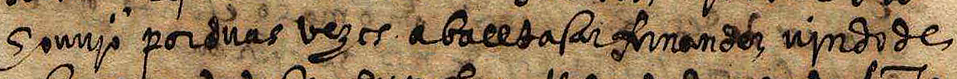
E ouujo por duas vezes a balltasar fernandez ujndo de
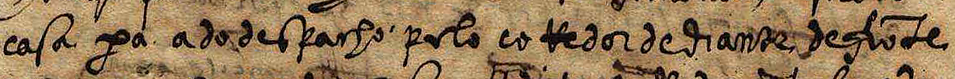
casa ꝑa a do despacho polo coRedor de diante defrōte
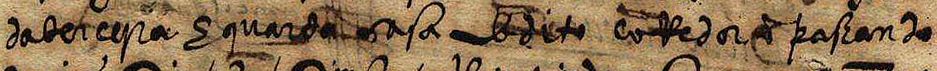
da terçejra E quarta casa do dito coRedor e passando
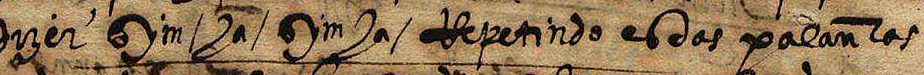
dizer sym / Ja / sym Ja / Repetindo estas palauras
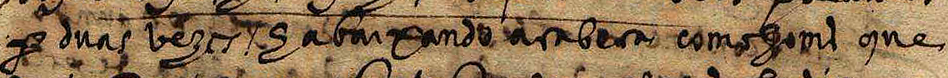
ꝑ duas vezes / E abaixando a cabeça como homē que
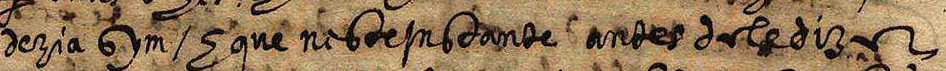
dezia sym / E que neste jnstante antes dele dizer
